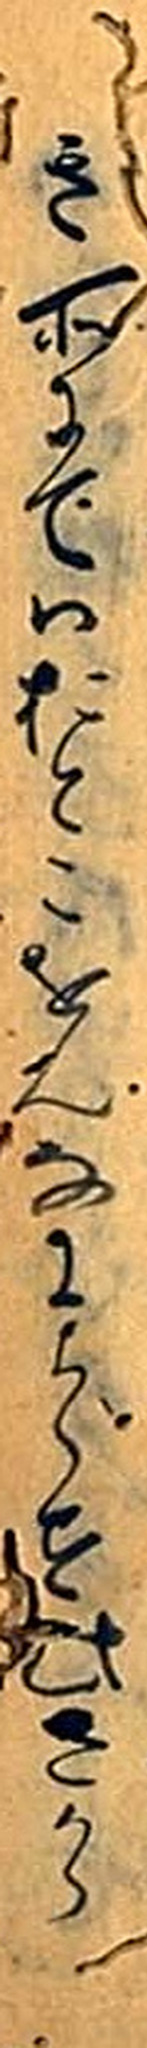き所にてはおとこをんなによらす此さから

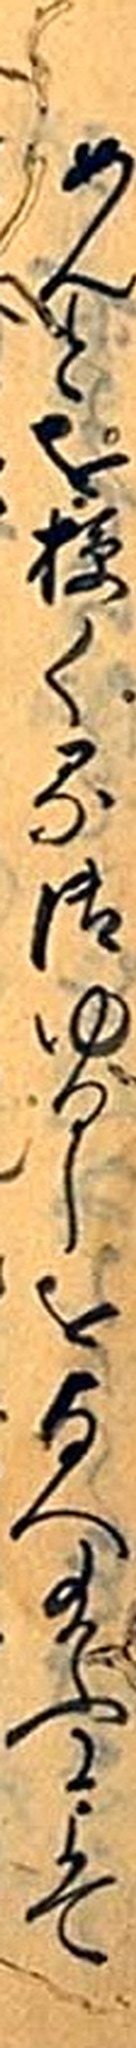めんとを授くる御ゆるしを与へ給ふによて
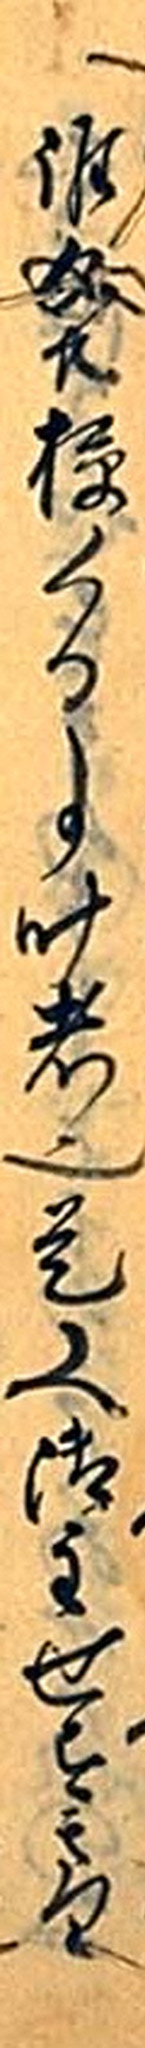誰成共授くる事叶者也是又御主せすきり
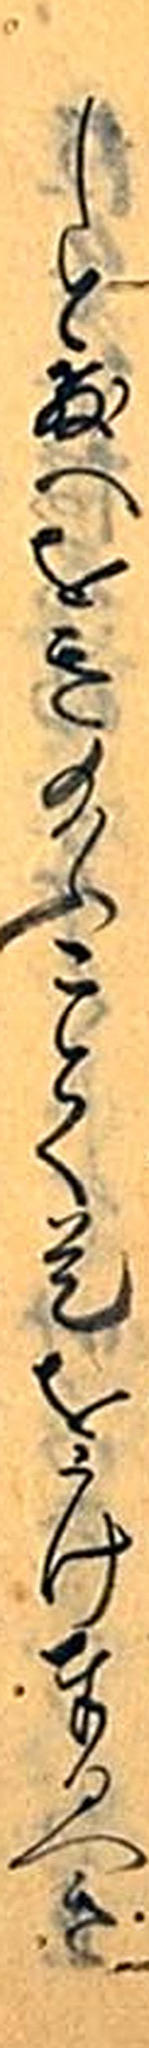しと教へをき給ふことく是をうけ奉るへき
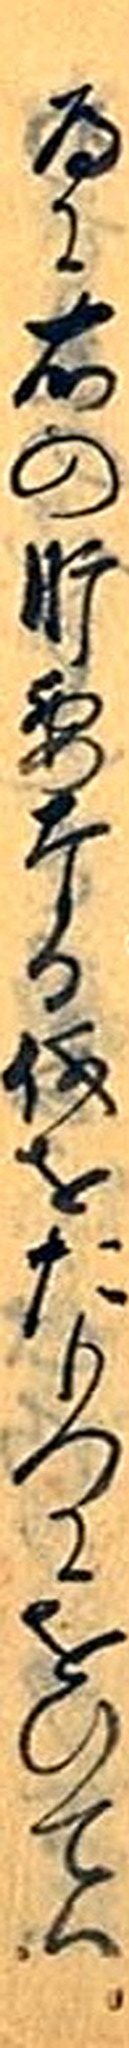為に右の肝要なる儀をたもつにをひては
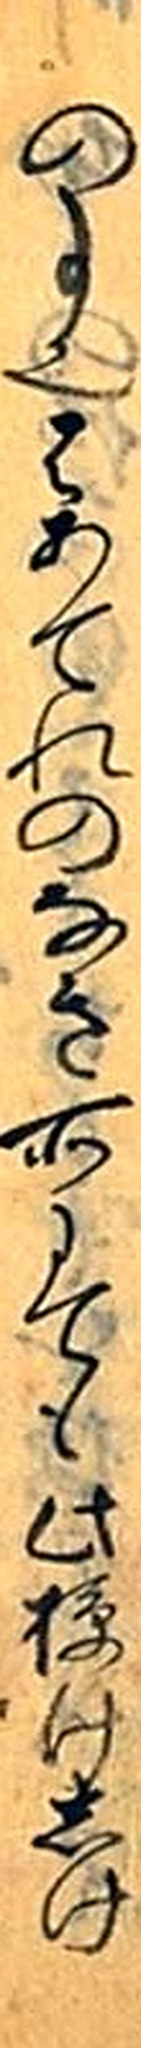の事也はあてれのなき所にても此授けしけ
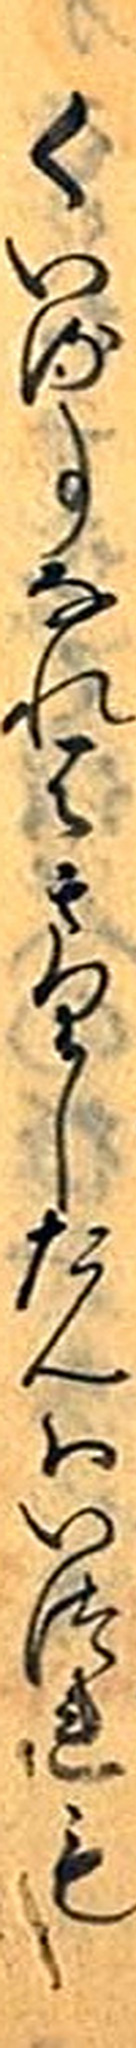くいる事なれはきりしたんはいつれも
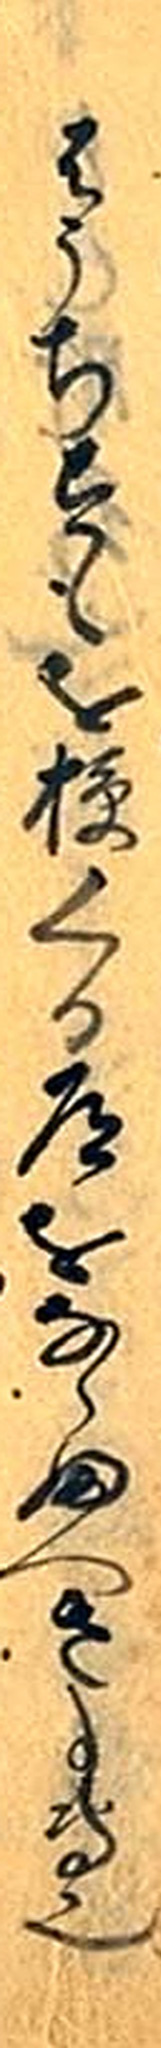はうちすもを授くる道をならふへき事専也
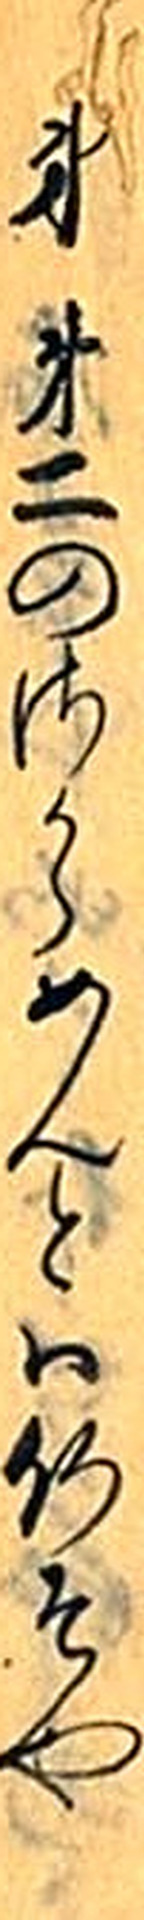弟第二のさからめんとは何そや
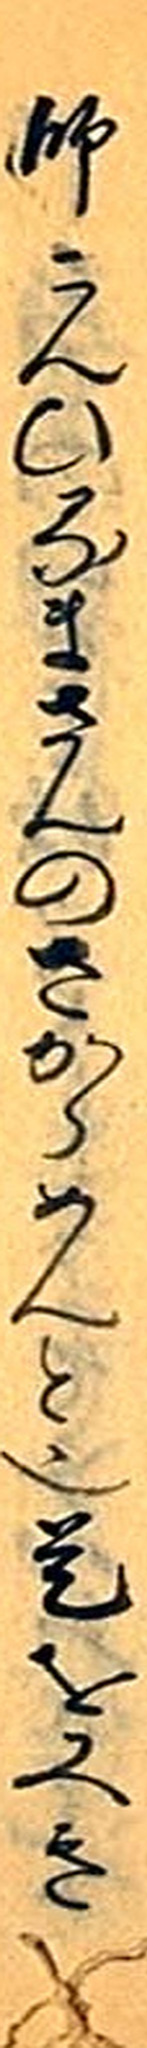師こんひるまさんのさからめんと也是を又き
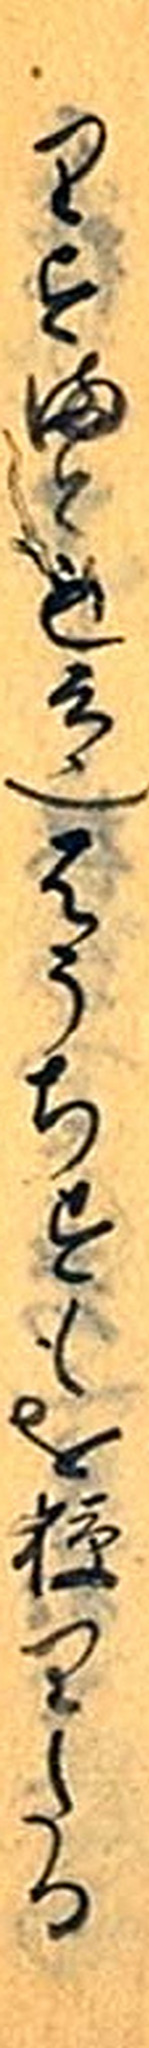りすまとも云也はうちすもを授りたる
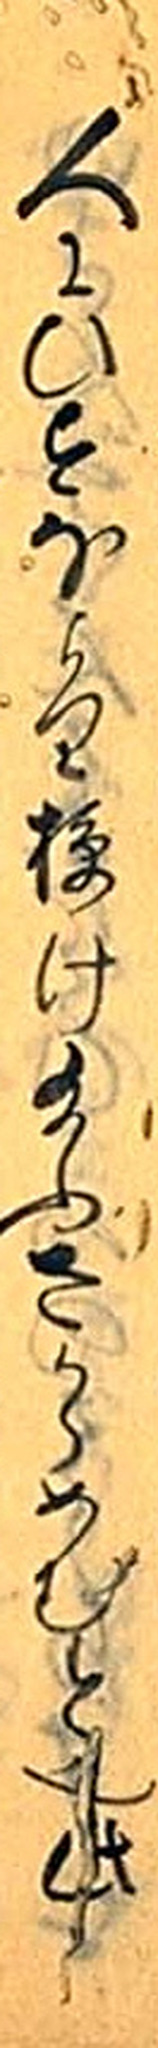人にひすほより授け給ふさからめむと也此
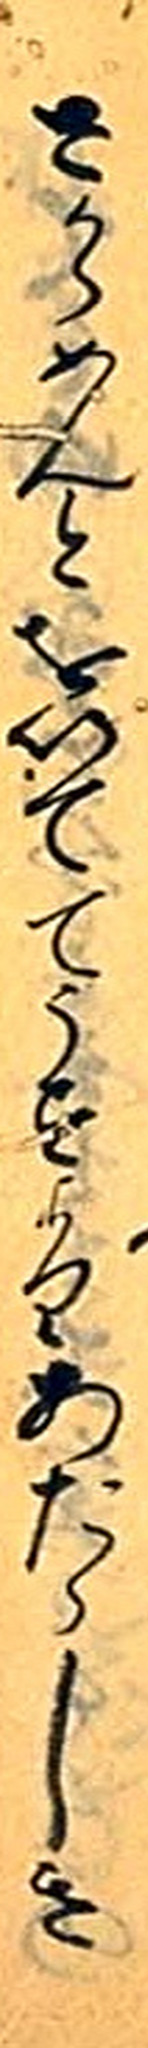さからめんとを以ててうすよりあたらしき
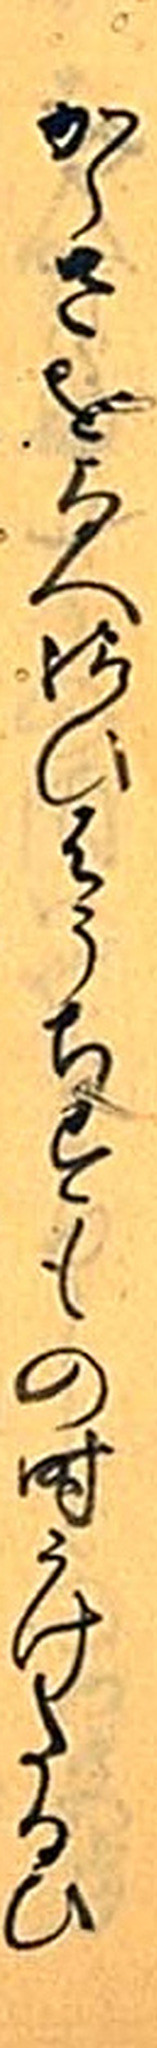からさを与へ給ひはうちすもの時うけたるひ
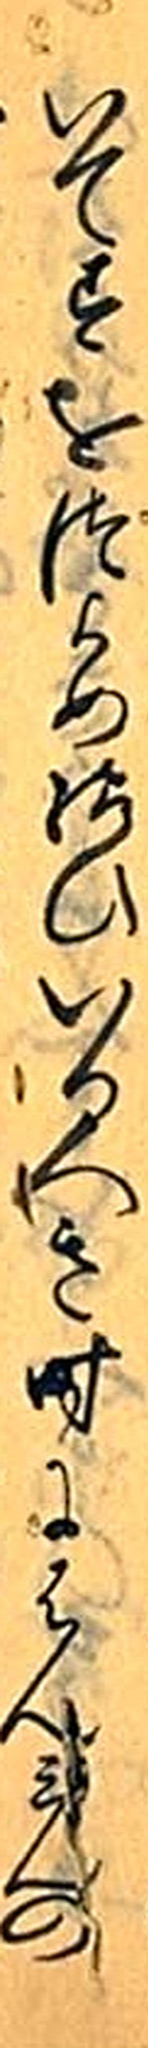いてすをつよめ給ひいるへき時にはんみんの
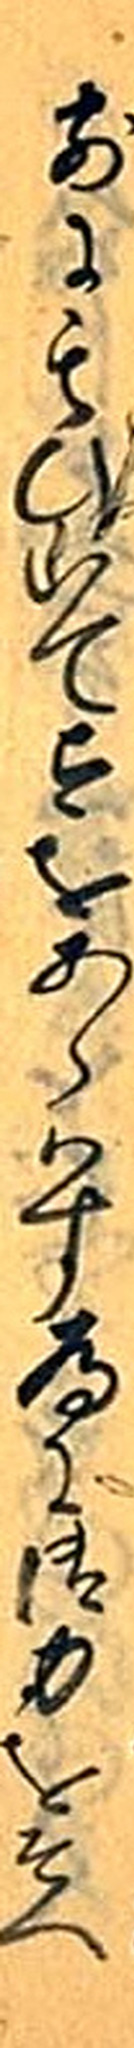前に其ひいてすをあらはす為に御力をそへ
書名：ドチリナ・キリシタン
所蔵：東京大学総合図書館 / General Library in the University of Tokyo
